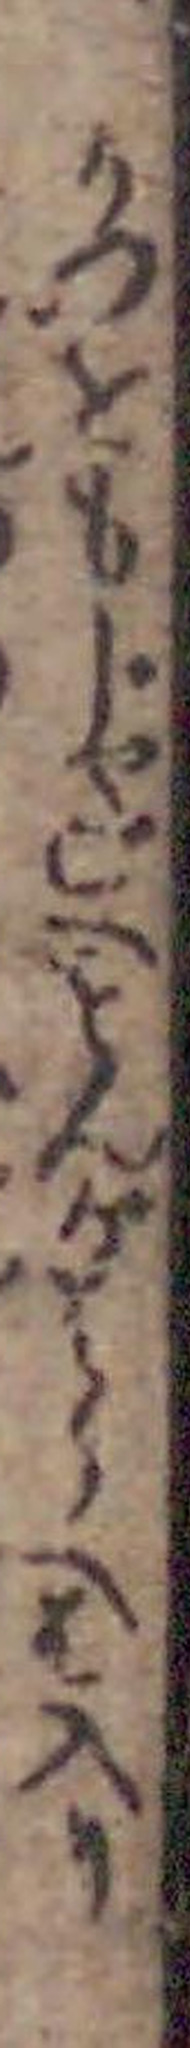かつをもじやごへもんがはらへは入り
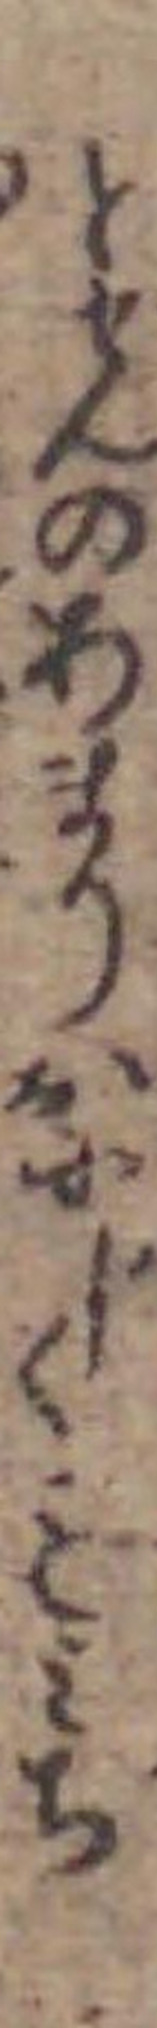とせんのあまりおにじくもみち
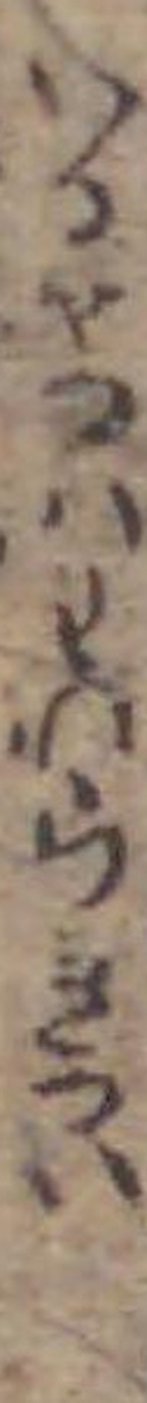いるやつはわれらきつい
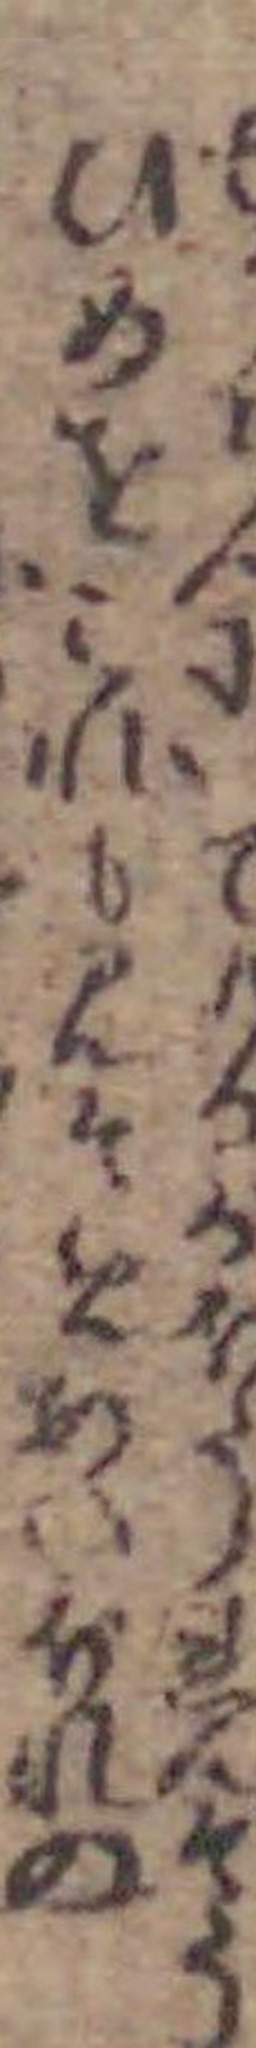ひめをこれも見そめあいぼれの
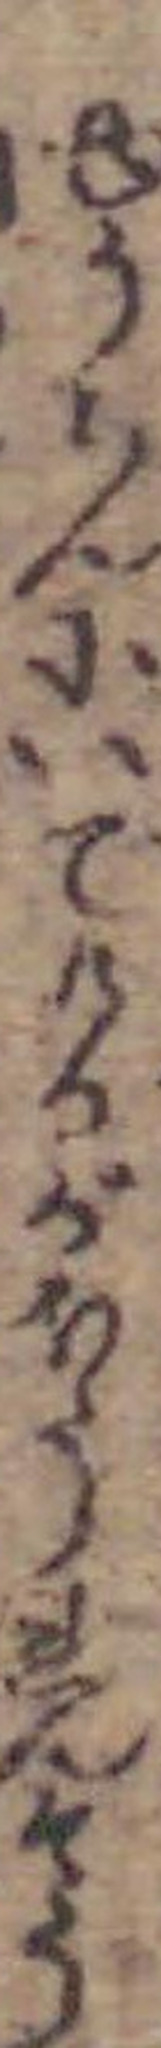ゆうらんにいでけるがほうれんそう
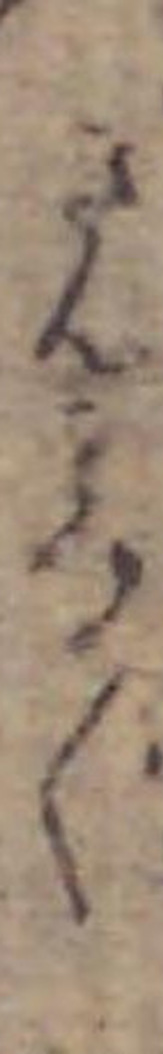きんもつ〳〵
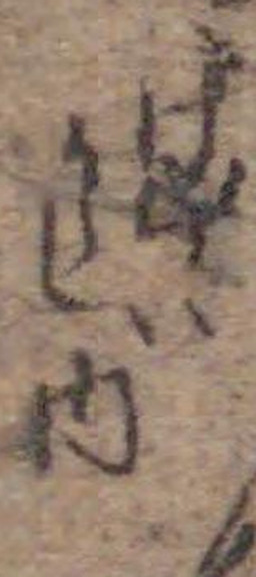からし門

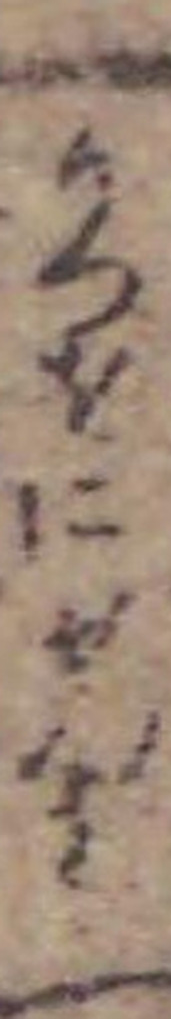かつをにせんを
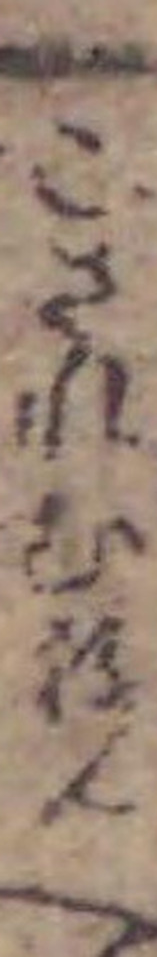こされむねん
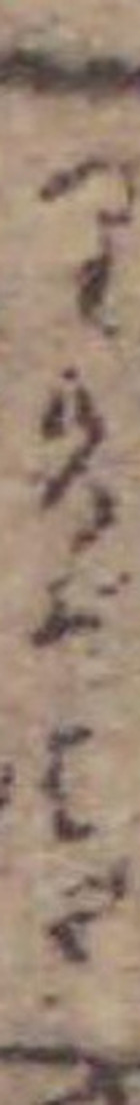じけるが
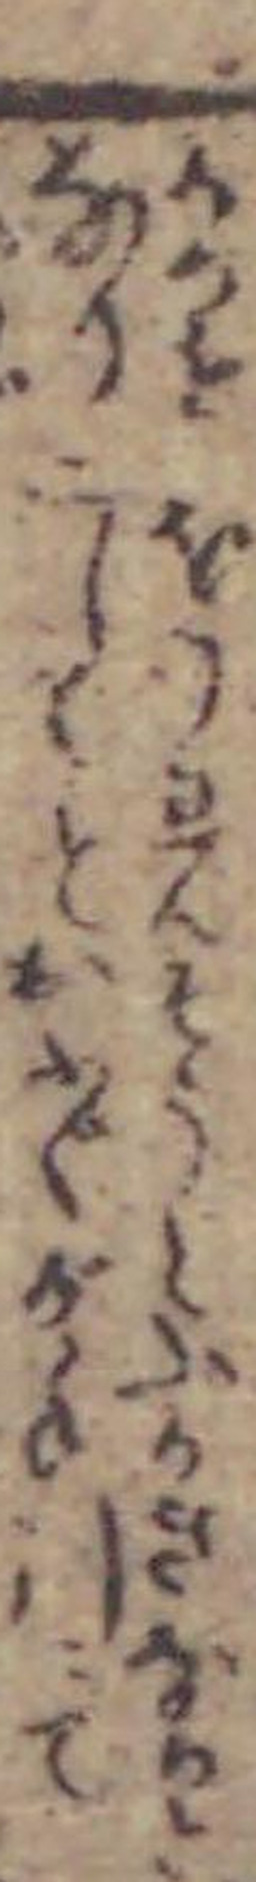なりこしもとおふぐが手引にて
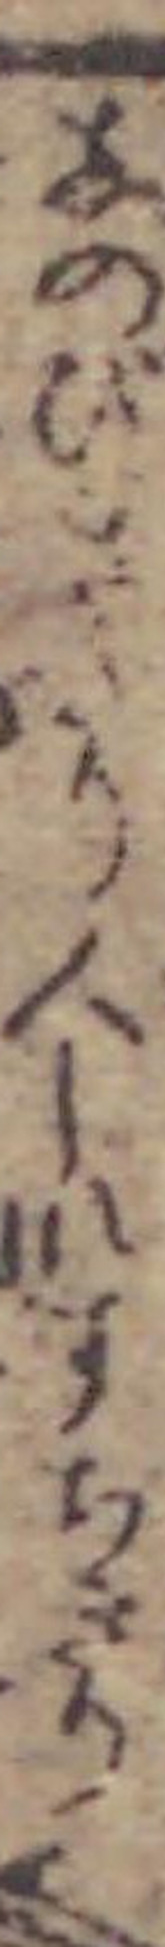しのびきたり人しれすちきり
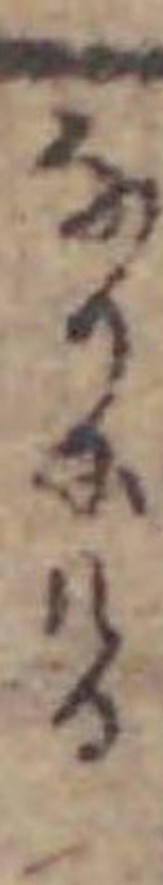なりにける
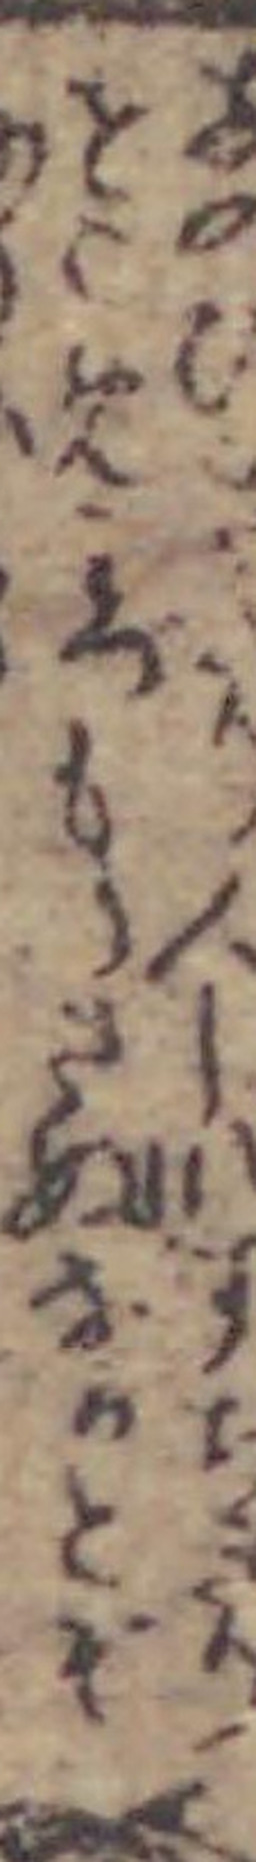をこめみづもらさぬなかとぞ
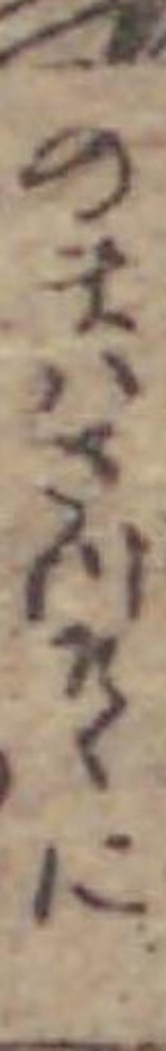のまはさつそくに
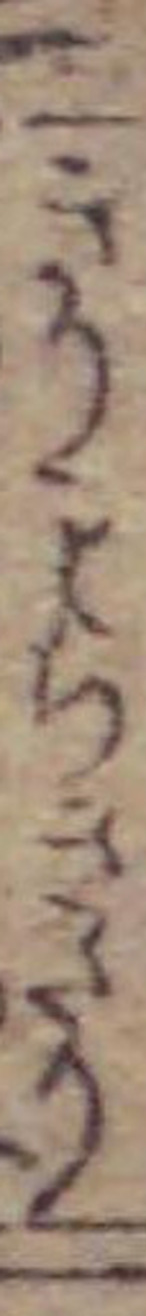きりもちきたり
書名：腹京師食物合戦 : 2巻
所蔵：国立国会図書館 National Diet Library, JAPAN
